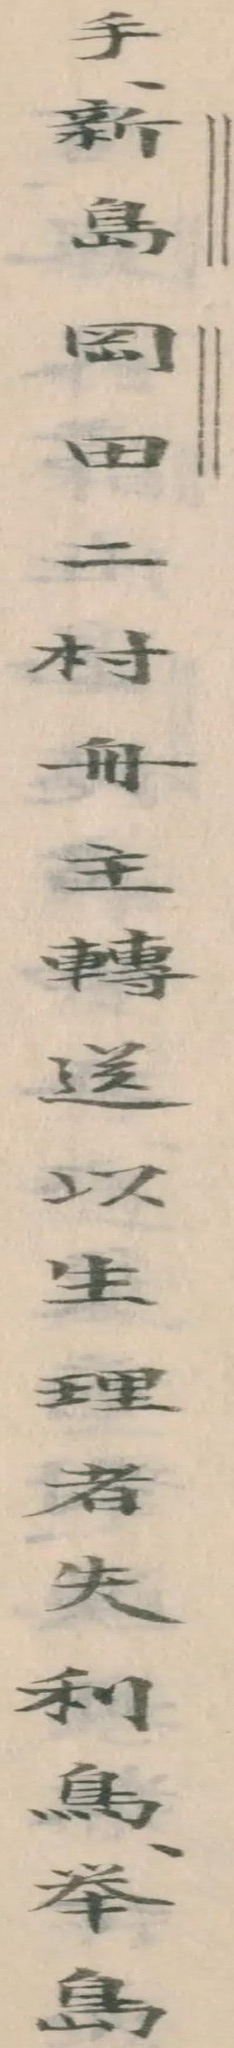乎、新島岡田二村舟主転送以生理者失利鳥、挙島
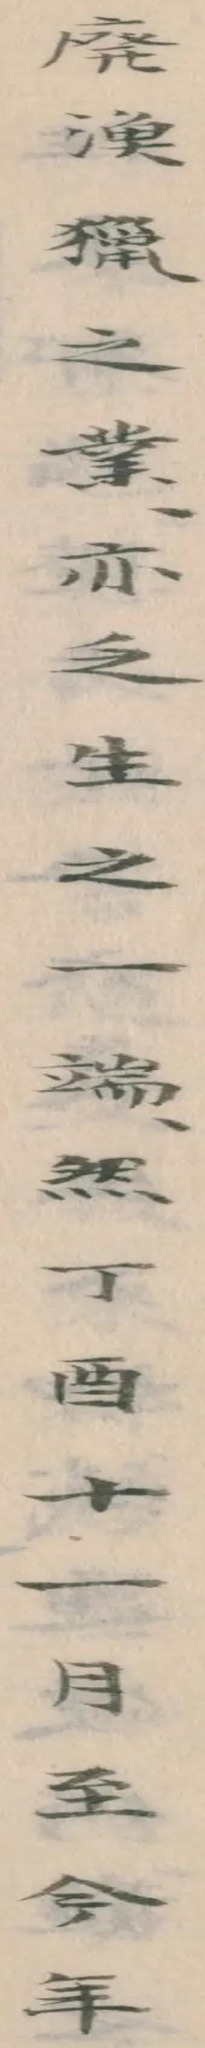廃漁猟之業、亦乏生之一端、然丁酉十一月至今年
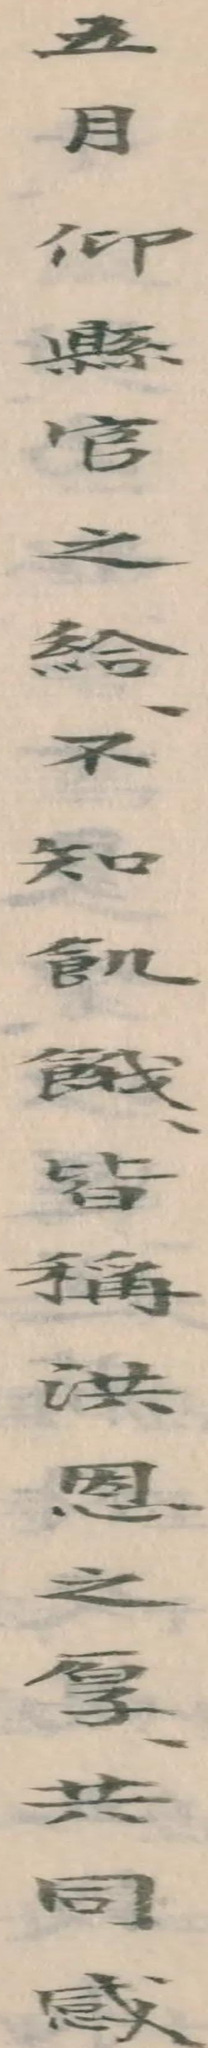五月仰県官之給、不知飢餓、皆称洪恩之厚、共同感
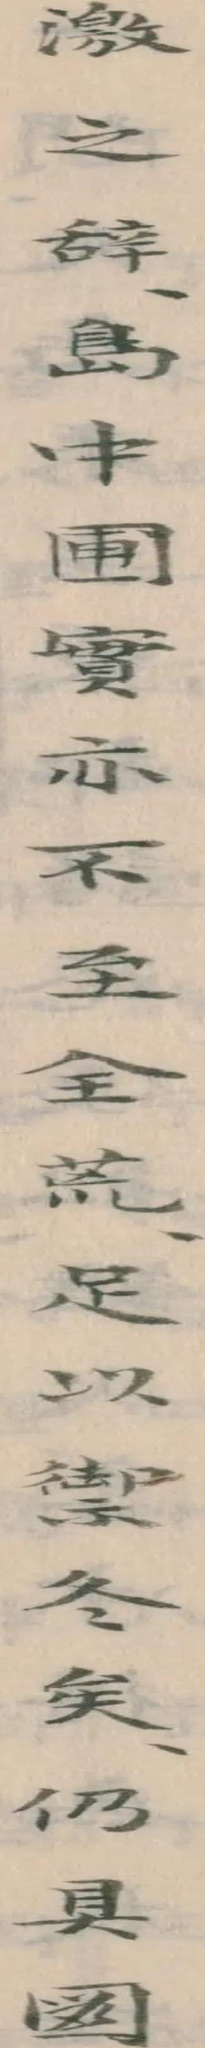激之辞、島中圃実亦不至全荒、足以禦冬矣、仍具国
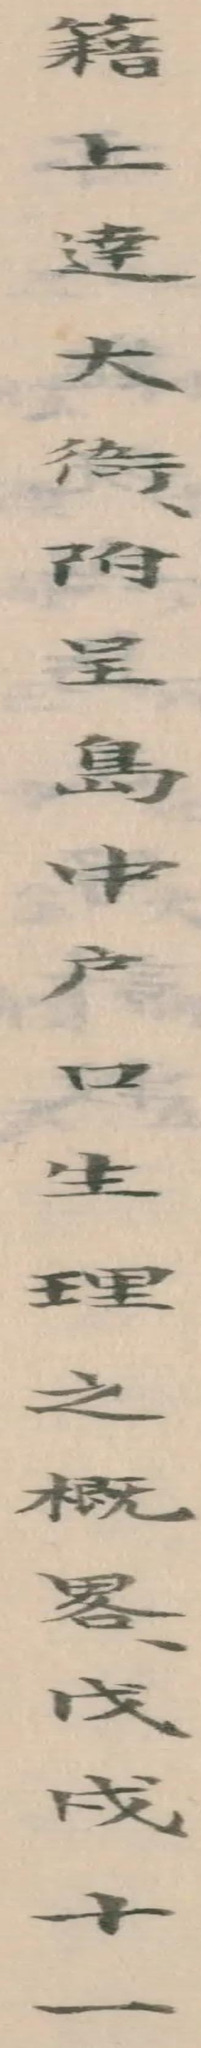籍上達大衙、附呈島中戸口生理之概略、戊戌十一
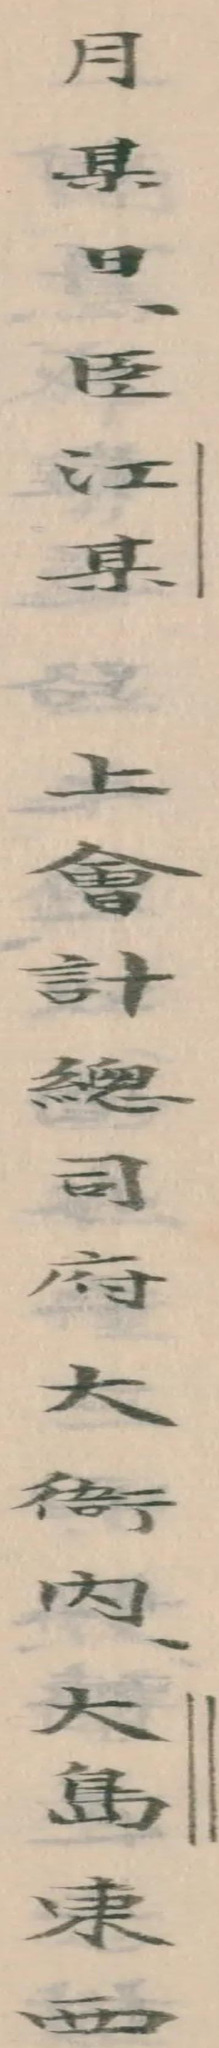月某日、臣江某上会計総司府大衙内、大島東西
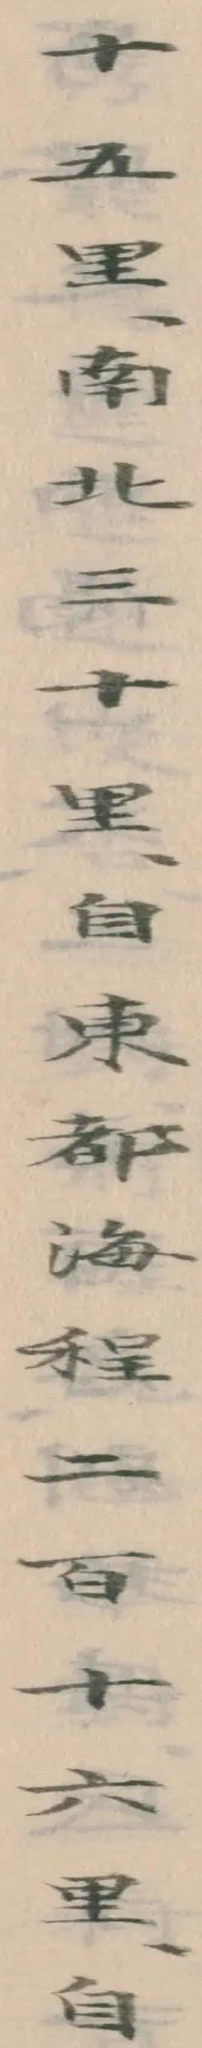十五里、南北三十里、自東都海程二百十六里、自
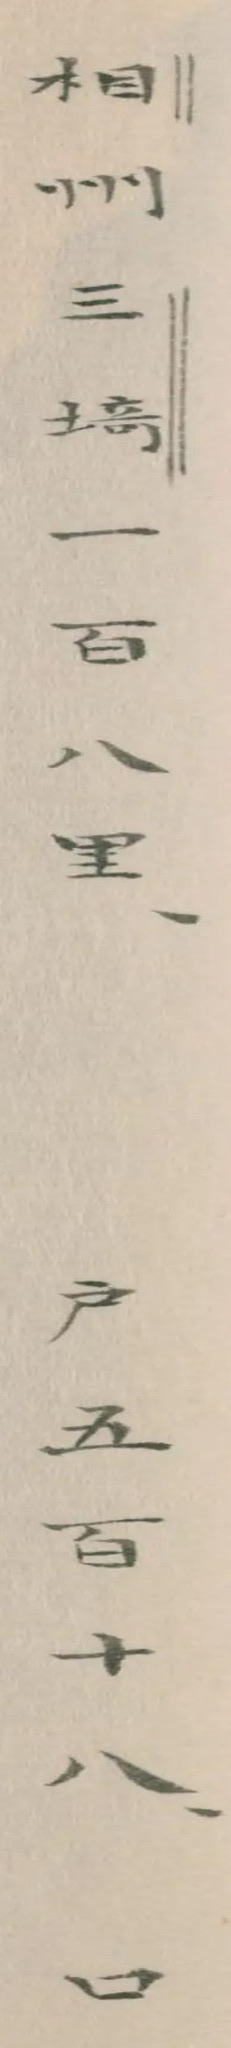相州三埼一百八里、戸五百十八、口
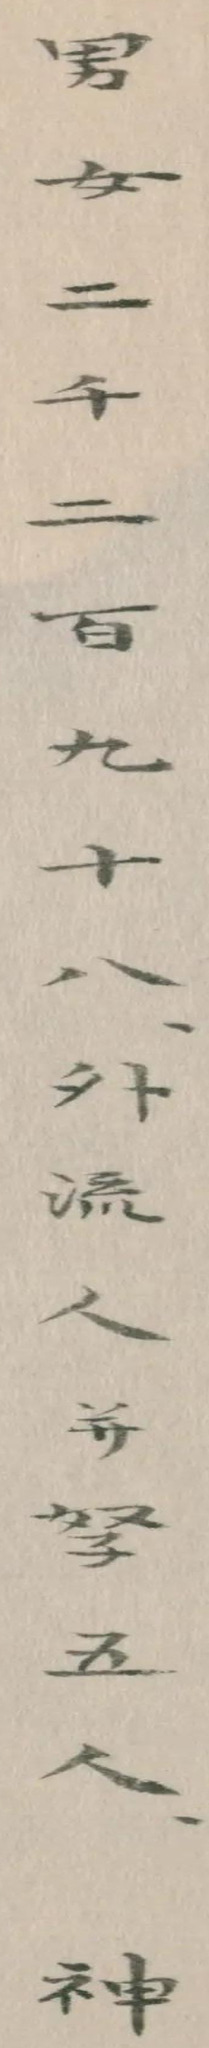男女二千二百九十八、外流人幷孥五人、神
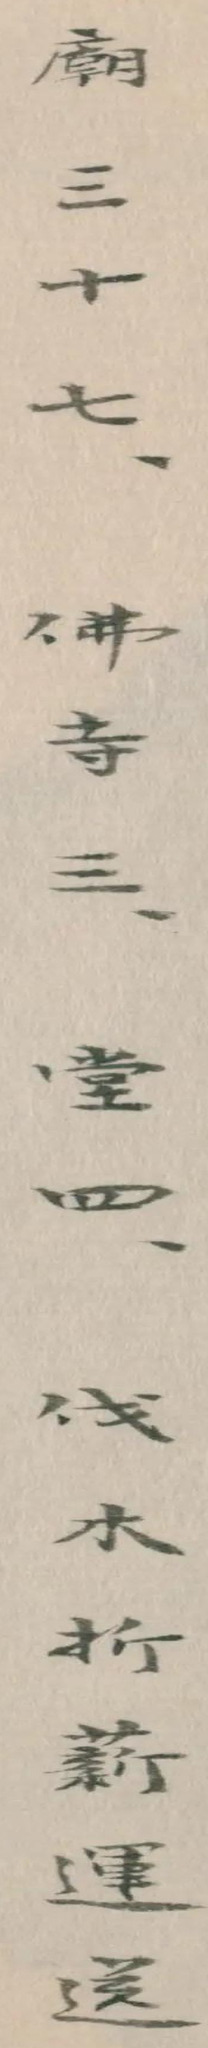廟三十七、仏寺三、堂四、伐木折薪運送
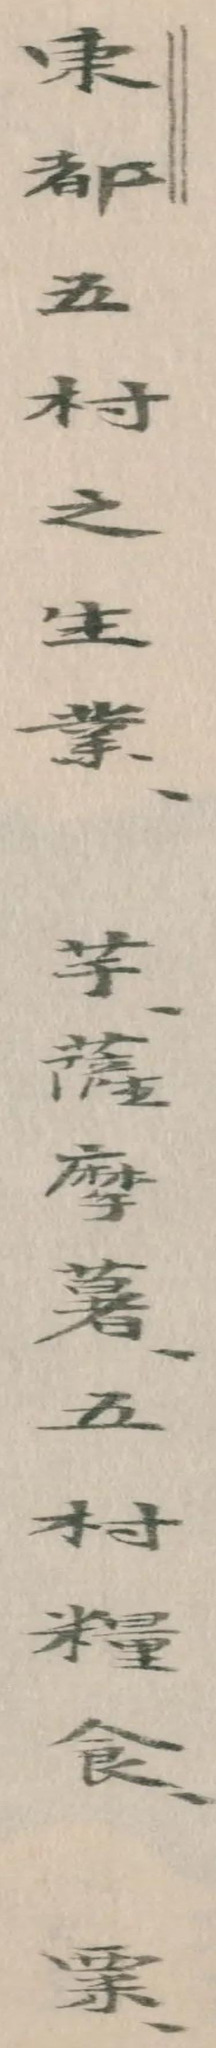東都五村之生業、芋、薩摩薯、五村糧食、粟、
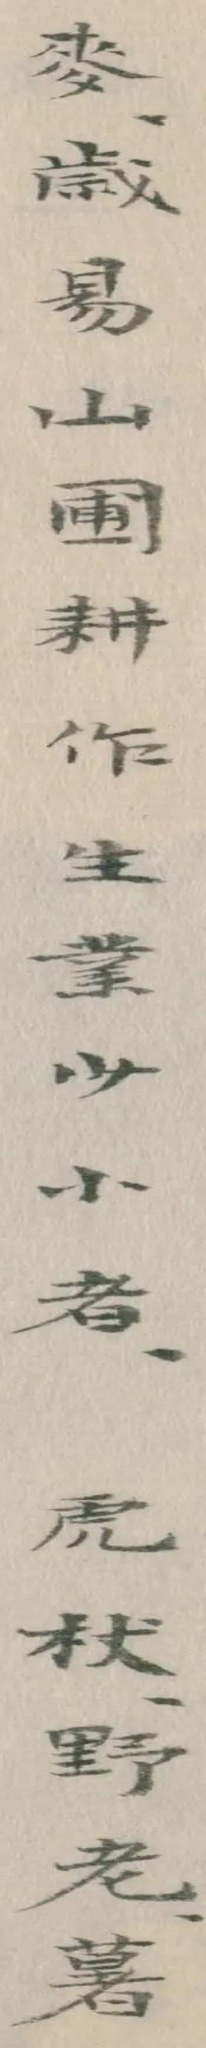黍、歳易山圃耕作生業少小者、虎杖、野老、薯
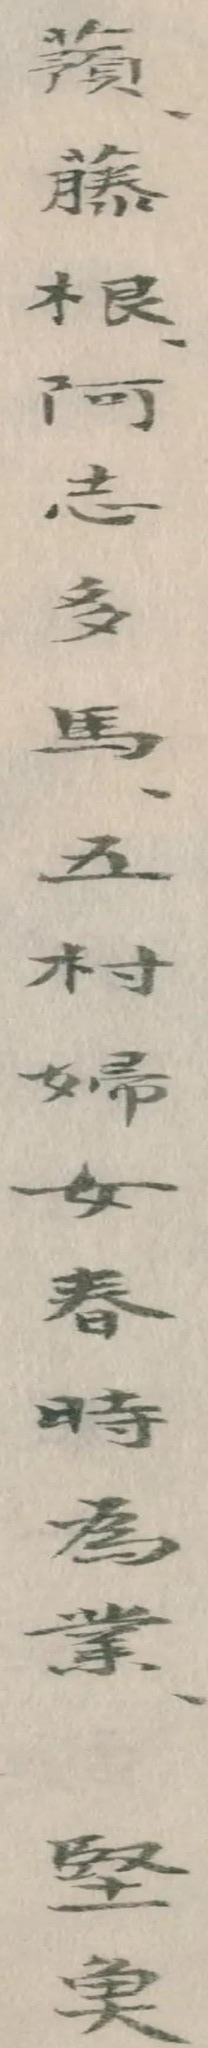蕷、藤根、阿志多馬、五村婦女春時為業、堅魚
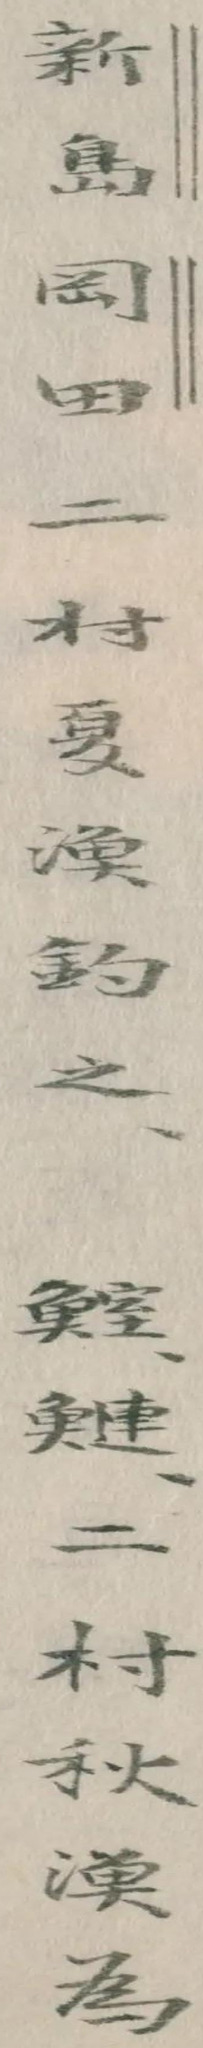新島岡田二村夏漁釣之、鰘、鰱、二村秋漁為
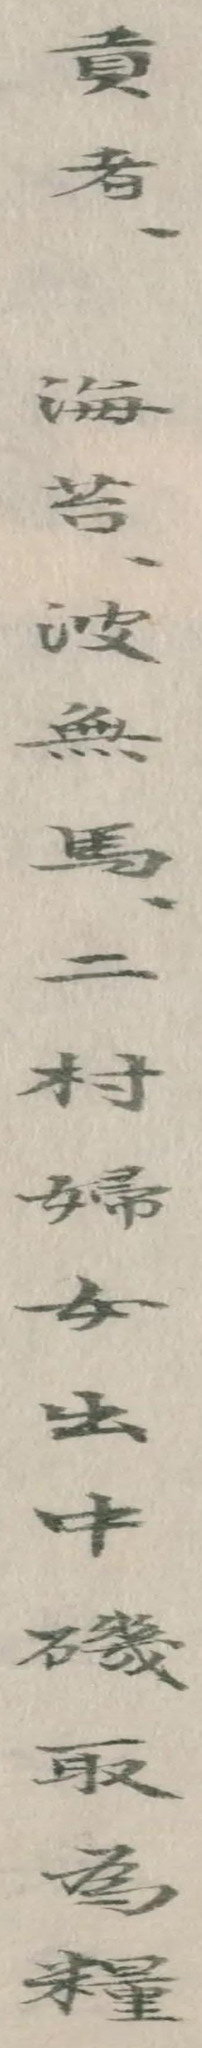貢者、海苔、波無馬、二村婦女出中磯取為糧
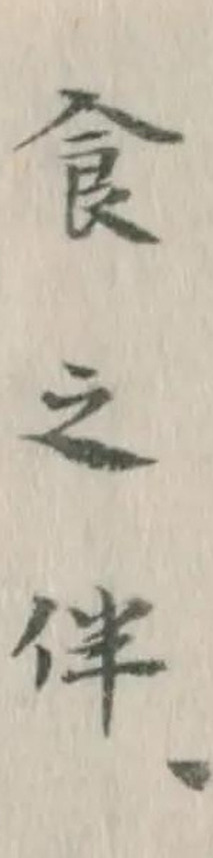食之伴、
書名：地災撮要. 巻11-12(地震之部)
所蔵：国立国会図書館 National Diet Library, JAPAN
